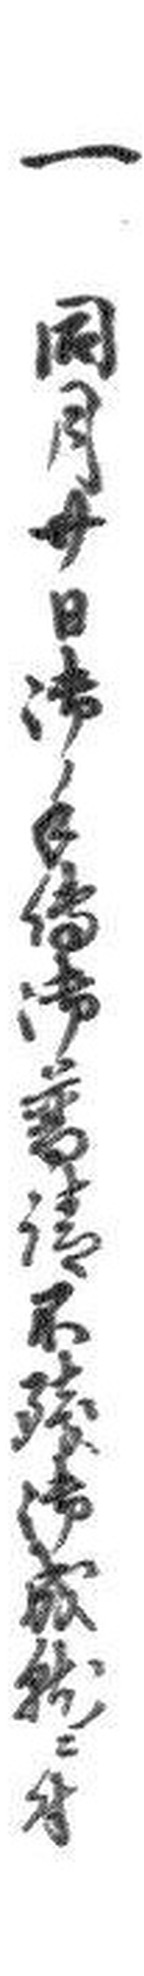一同月廿日御手伝御普請不残御成就ニ付
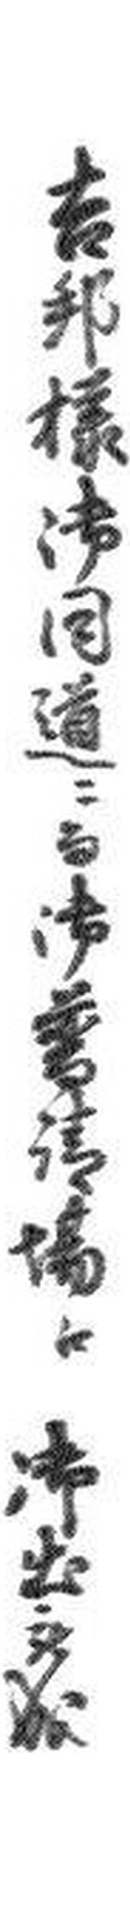吉邦様御同道ニ而御普請場江御出被成
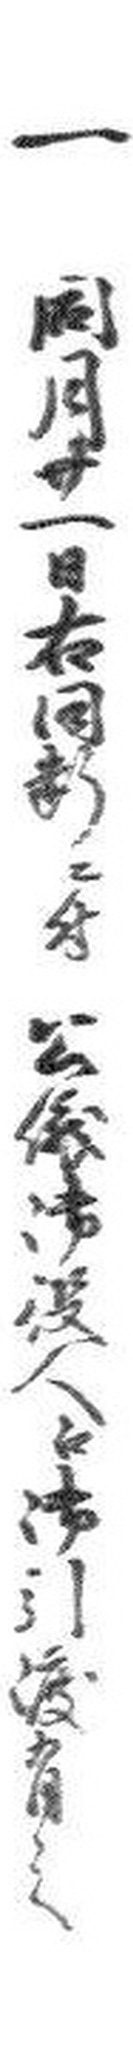一同月廿一日右同断ニ付公儀御役人江御引渡有之
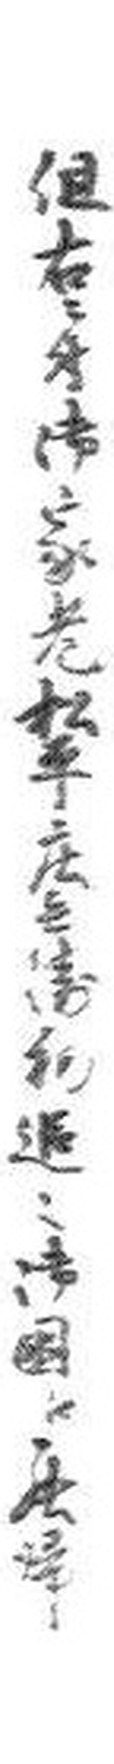但右ニ付御家老松平庄兵衛初追々御国江罷帰
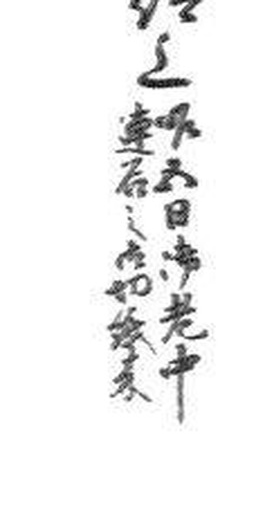連名之御切紙来

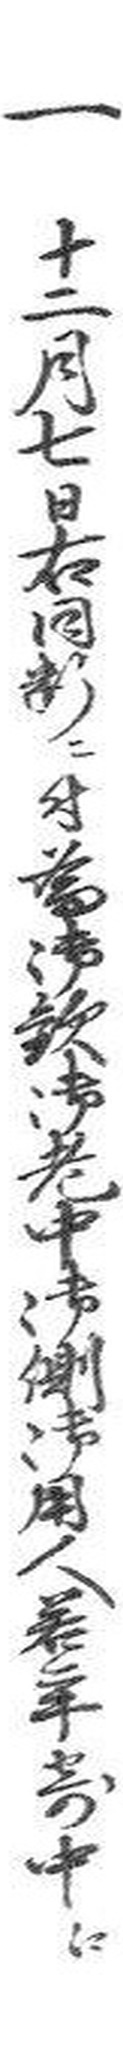一十二月七日右同断ニ付為御歓御老中御側御用人若年寄中江
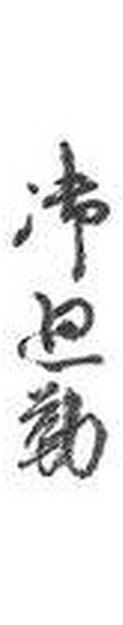御廻勤
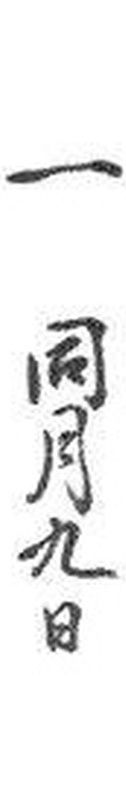一同月九日
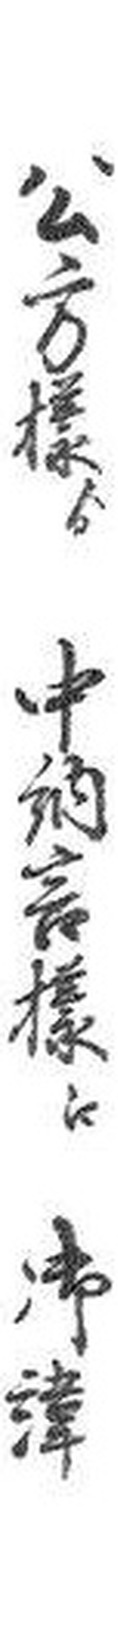公方様ゟ中納言様江御諱
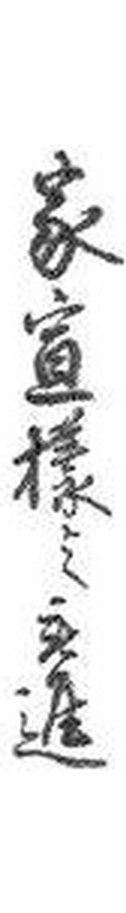家宣様与被進
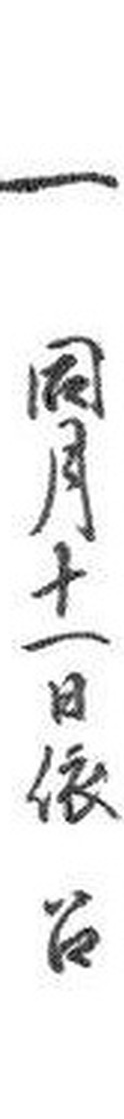一同月十一日依召
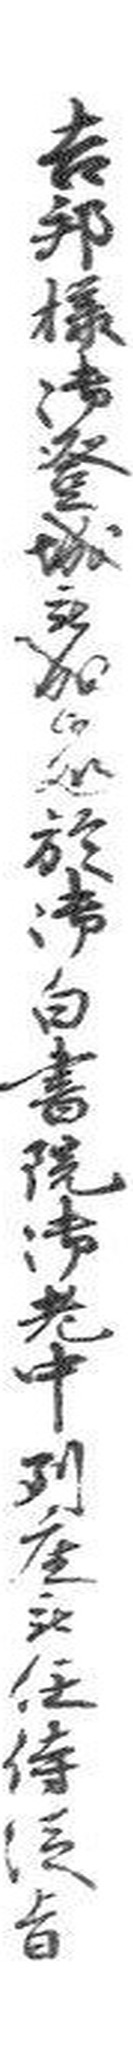吉邦様御登城被成候処於御白書院御老中列座被任侍従旨
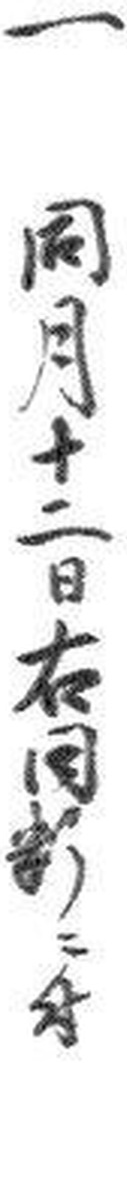一同月十二日右同断ニ付
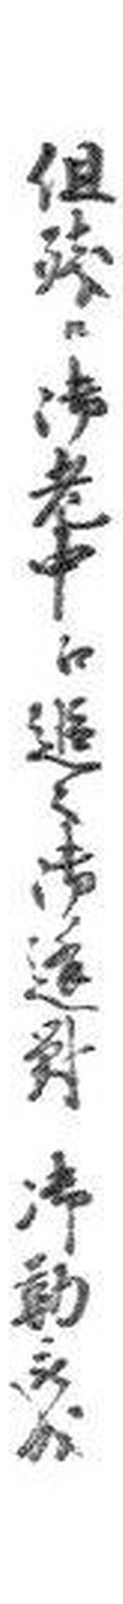但残ル御老中江追々御逢対御勤被成
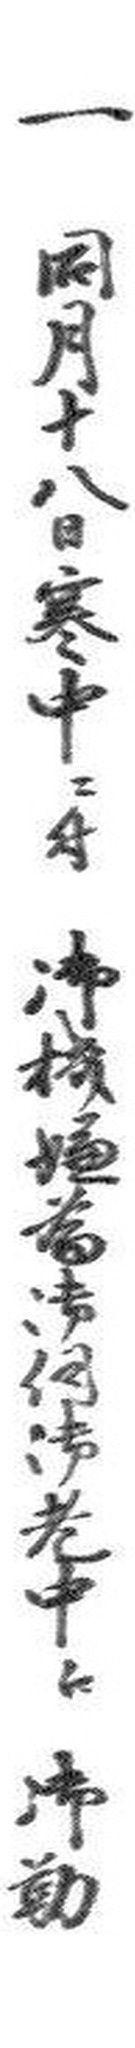一同月十八日寒中ニ付御機嫌為御伺御老中江御勤
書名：家譜 二十三 吉品公 従宝永元年到同二年
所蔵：福井県文書館 Fukui Prefectural Archives
